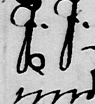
hat
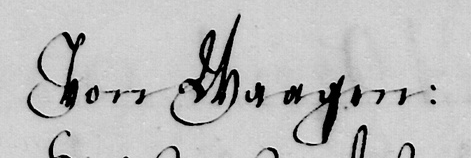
Von Waagen:
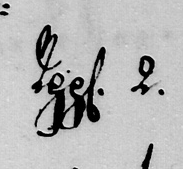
dto.
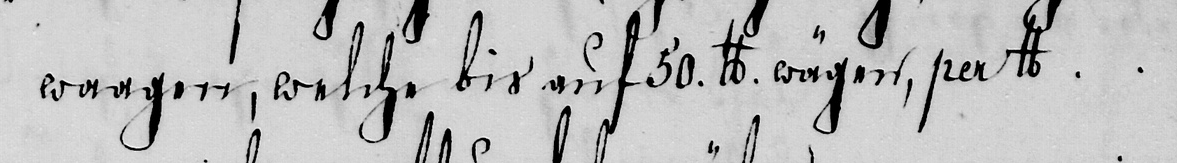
lwaagen, welche bis auf 50. lb. wägen, per lb.
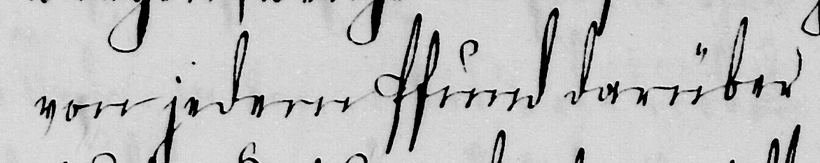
von jedem Pfund darüber
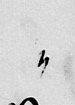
4.
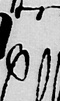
36.
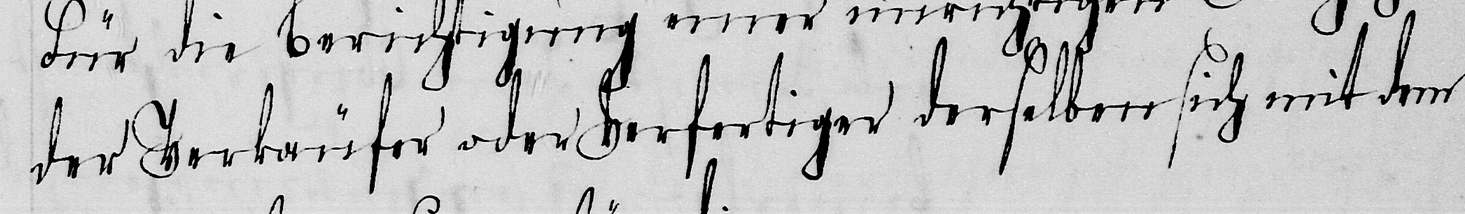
der Verkäufer oder Verfertiger derselben sich mit dem
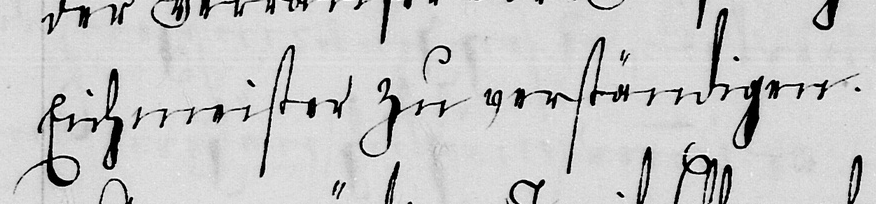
Eichmeister zu verständigen.
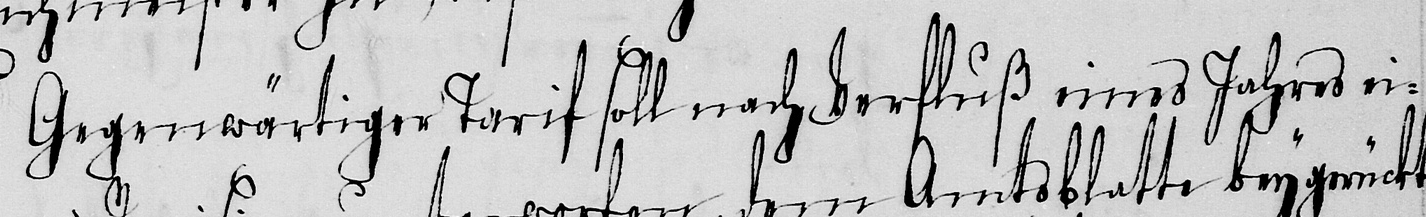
Gegenwärtiger Tarif soll nach Verfluß eines Jahres ei¬
